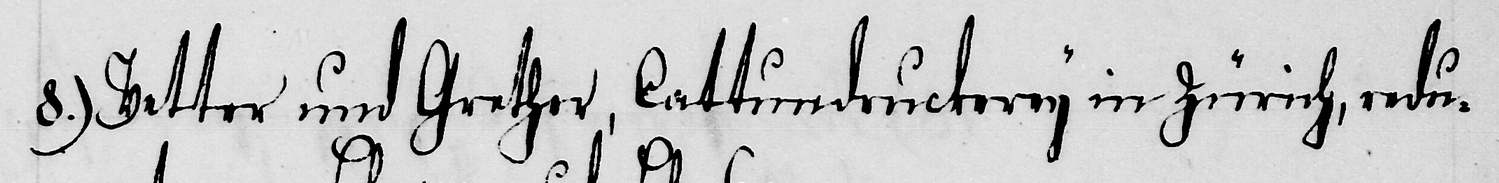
8.) Vetter und Grether, Cattundruckerey in Zürich, redu¬
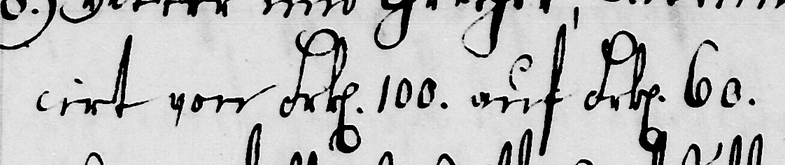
cirt von Frk[en]. 15. auf Frk[en].
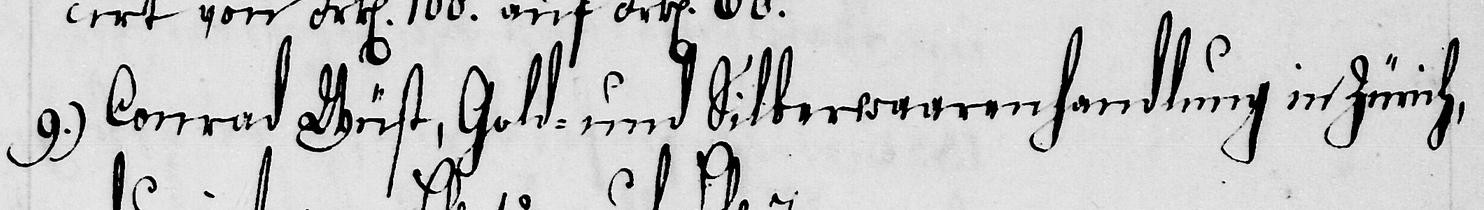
9.) Conrad Wüst, Gold- und Silberwaarenhandlung in Zürich,
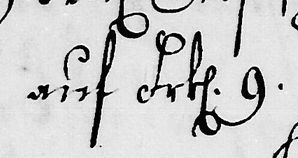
auf Frk[e¬
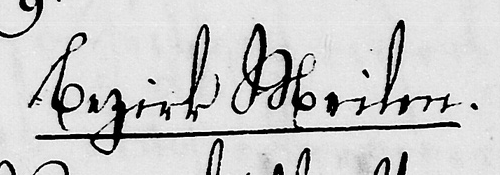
Bezirk Meilen.
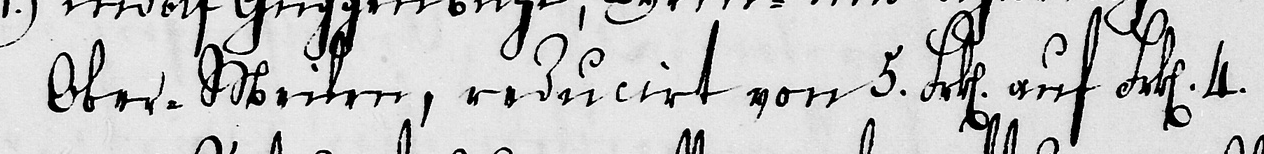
Ober-Meilen, reducirt von 5. Frk[en].
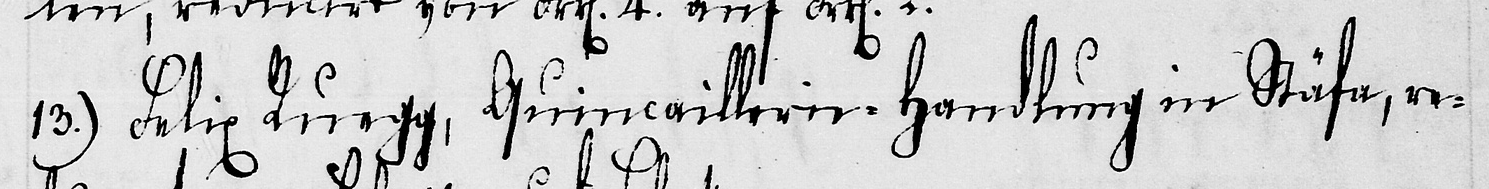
13.) Felix Ruegg, Quincaillerie-Handlung in Stäfa, re¬
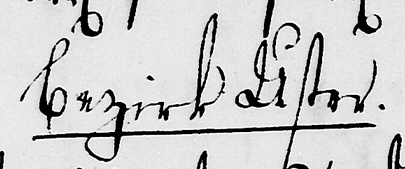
Bezirk Uster.
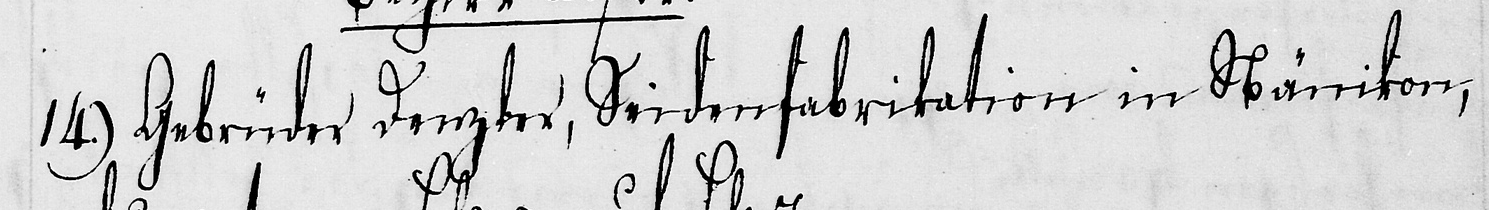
14.) Gebrüder Denzler, Seidenfabrikation in Nänikon,
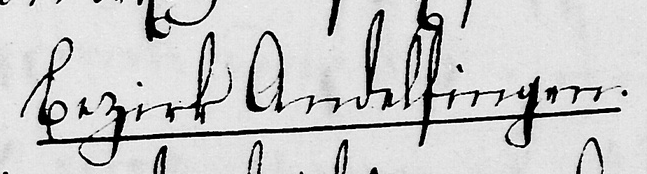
Bezirk Andelfingen.
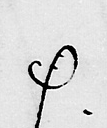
5.
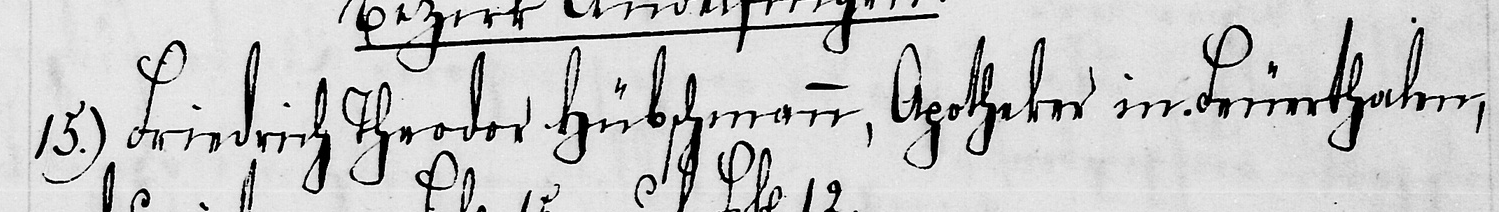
15.) Friedrich Theodor Hübschmann, Apotheker in Feuerthalen,
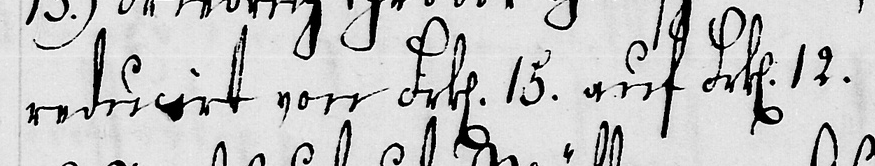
reducirt von Frk[en]. 9. auf Frk[en].
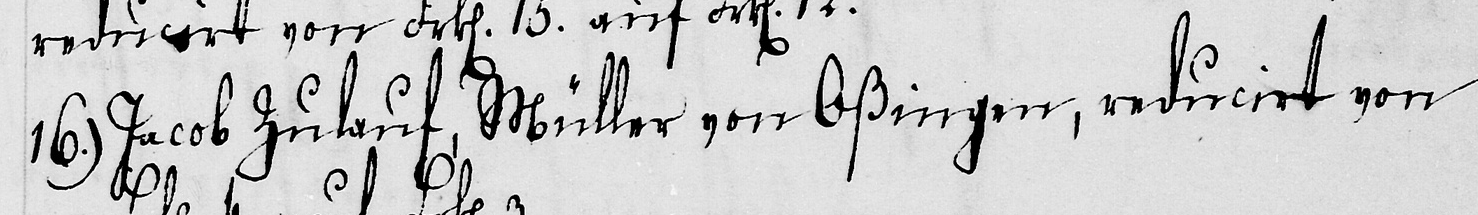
16.) Jacob Zulauf, Müller von Oßingen, reducirt von
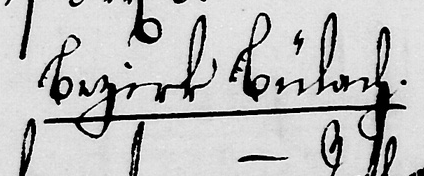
Bezirk Bülach.
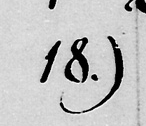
12.
